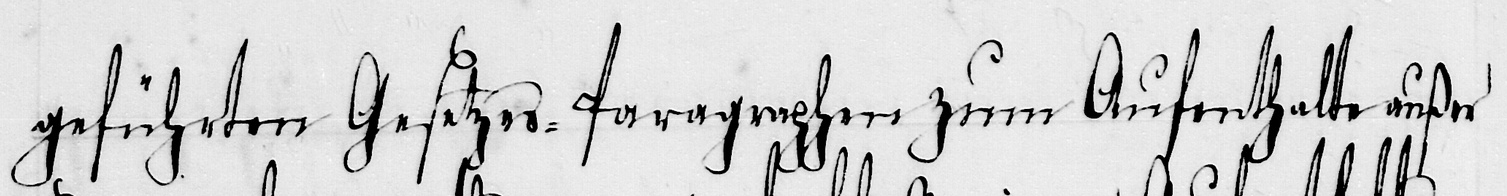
geführten Gesetzes-Paragraphen zum Aufenthalte außer
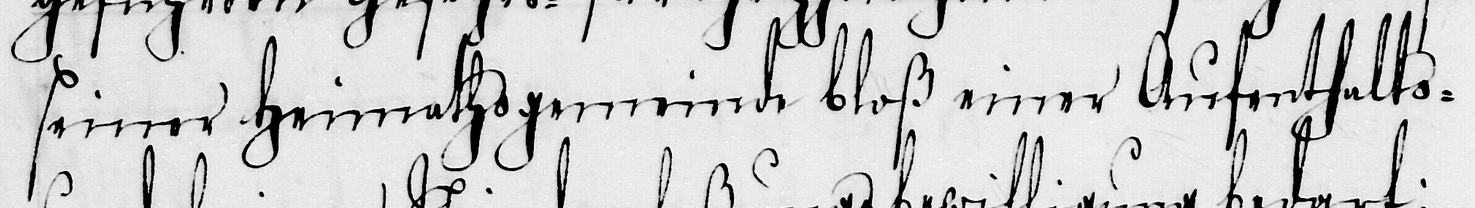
seiner Heimathsgemeinde bloß einer Aufenthalts-
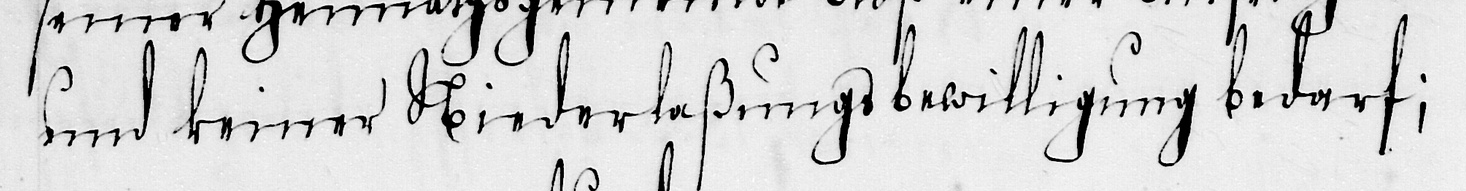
und keiner Niederlaßungsbewilligung bedarf;
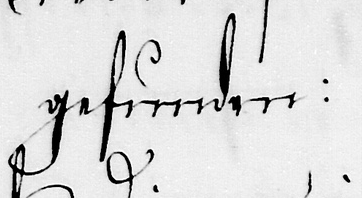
gefunden:
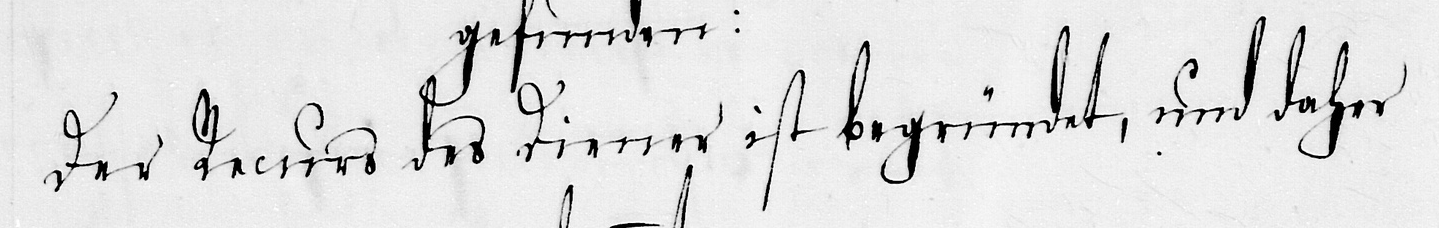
Der Recurs des Diener ist begründet, und daher
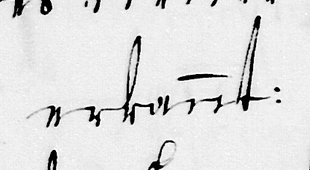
erkannt:
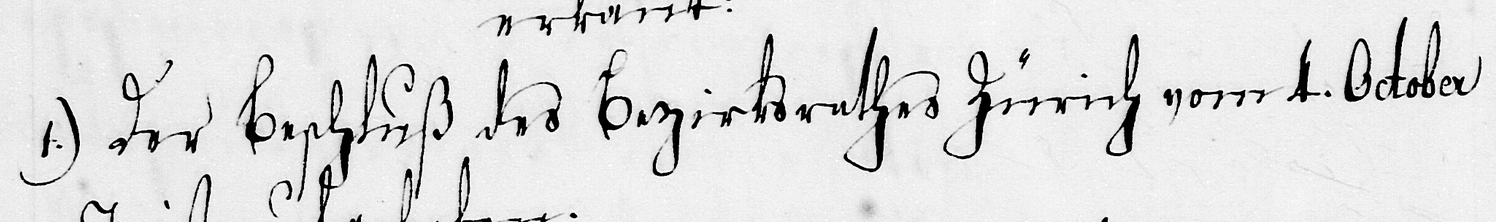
1.) Der Beschluß des Bezirksrathes Zürich vom 4. October
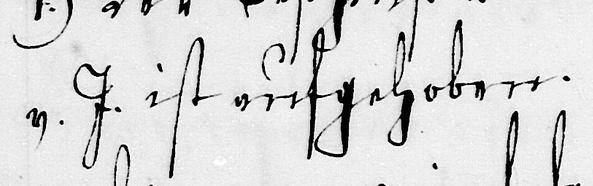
v. J. ist aufgehoben.
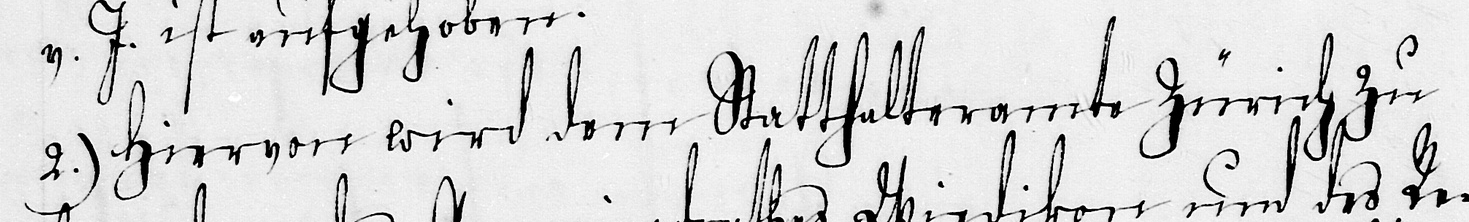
2.) Hiervon wird dem Statthalteramte Zürich zu
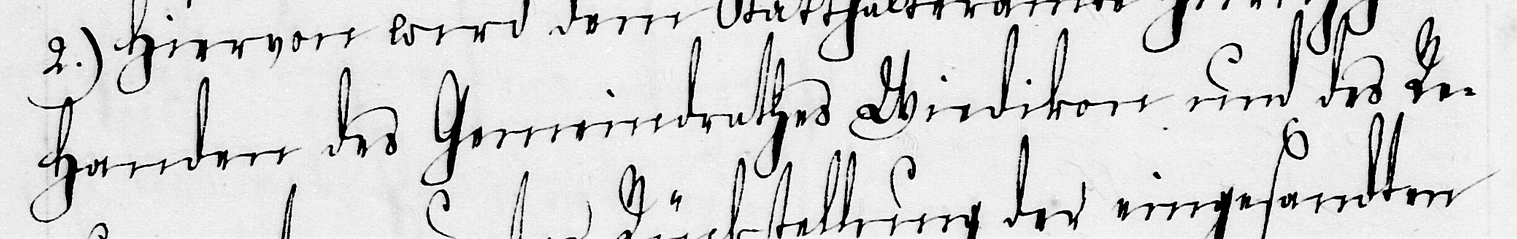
Handen des Gemeindrathes Wiedikon und des Re¬
